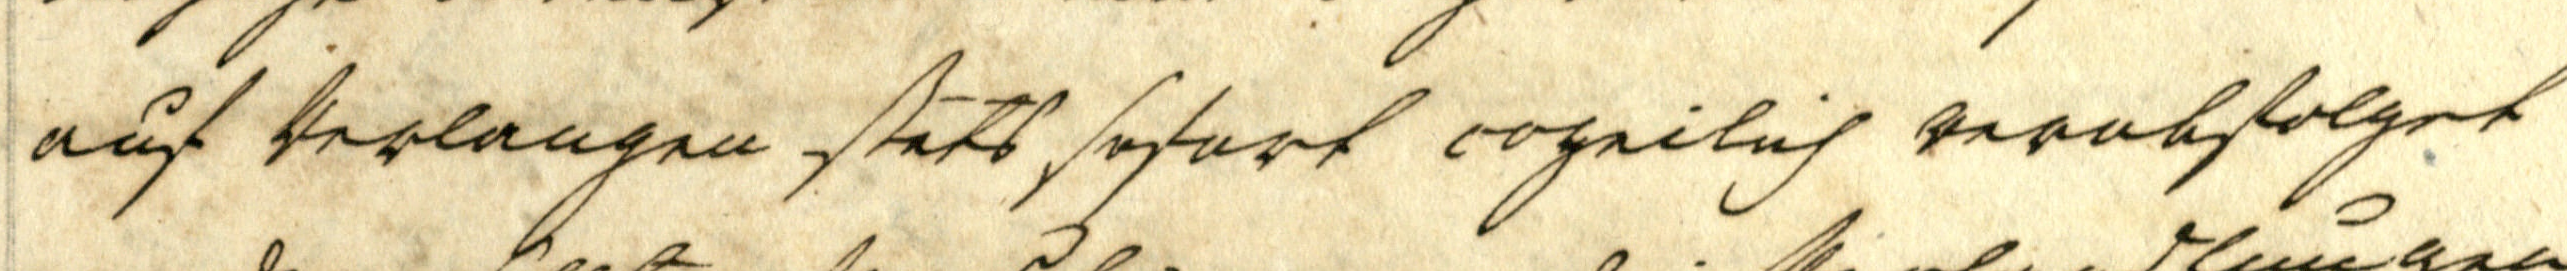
auf Verlangen stets sofort copeilich verabfolget
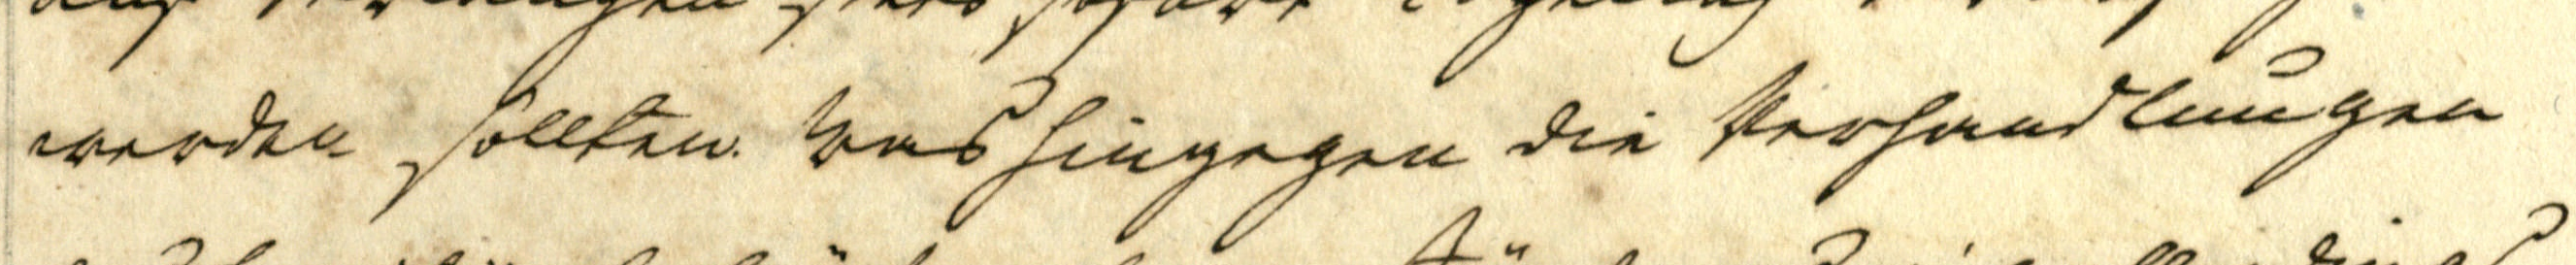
werden sollten. Was hingegen die Verhandlungen
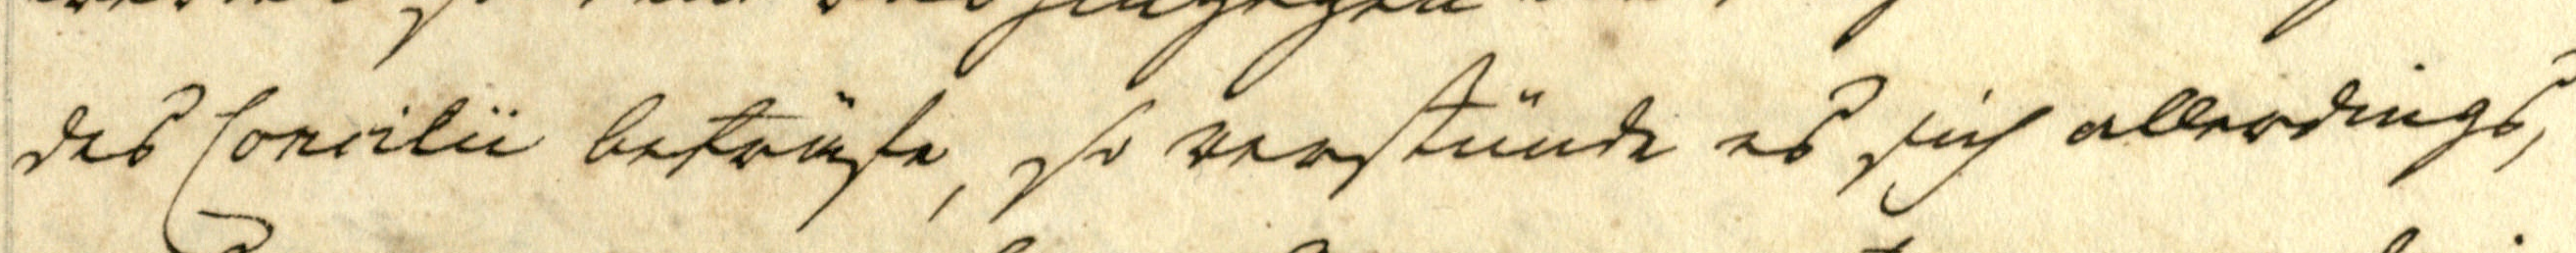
des Concilii beträfe, so verstünde es sich allerdings,
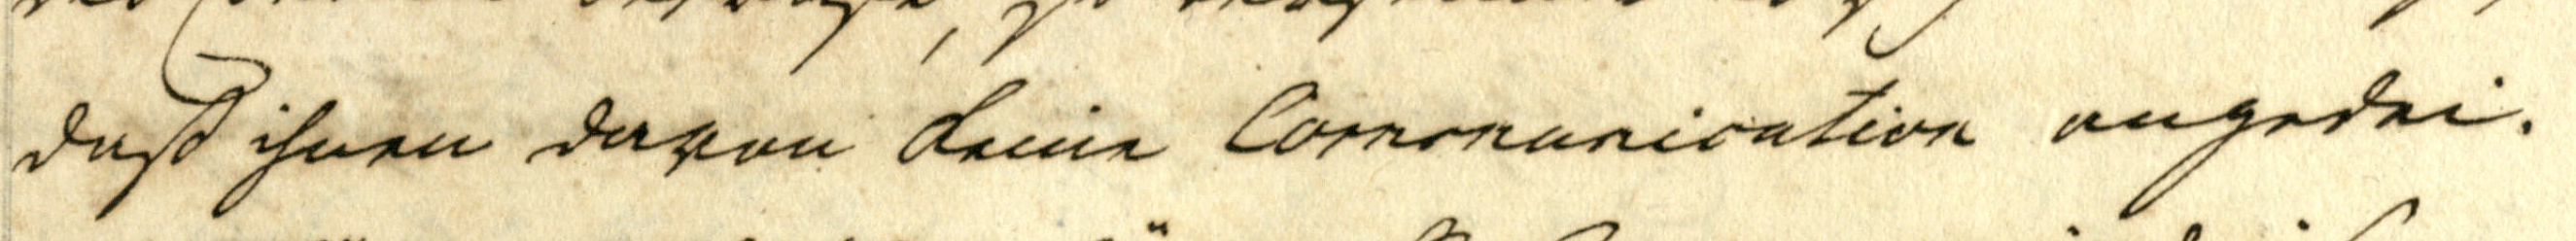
daß ihnen davon keine Communication angedei¬
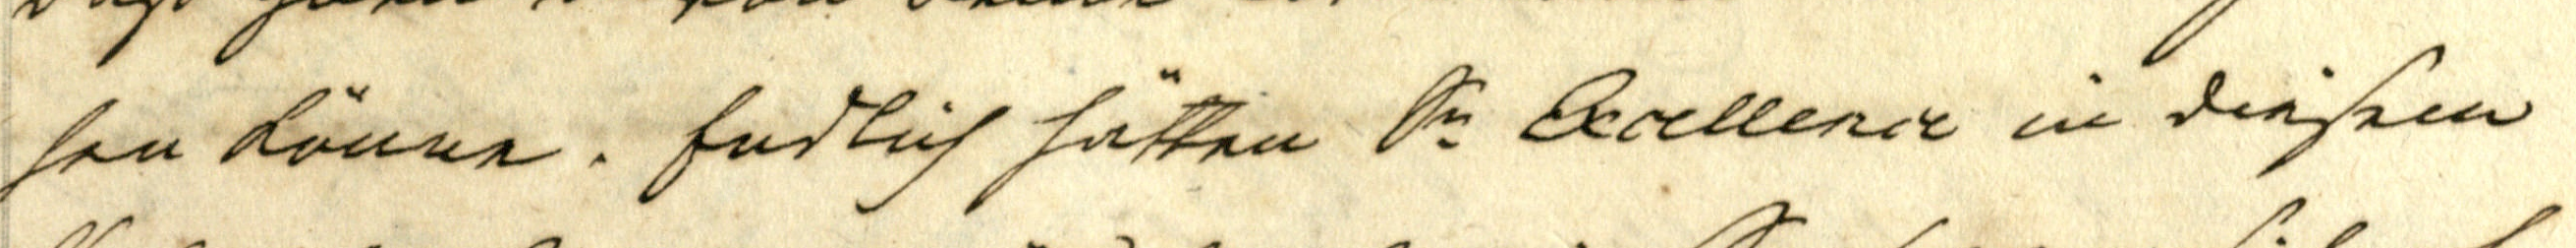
hen könne. Endlich hätten Sr Excellence in diesem
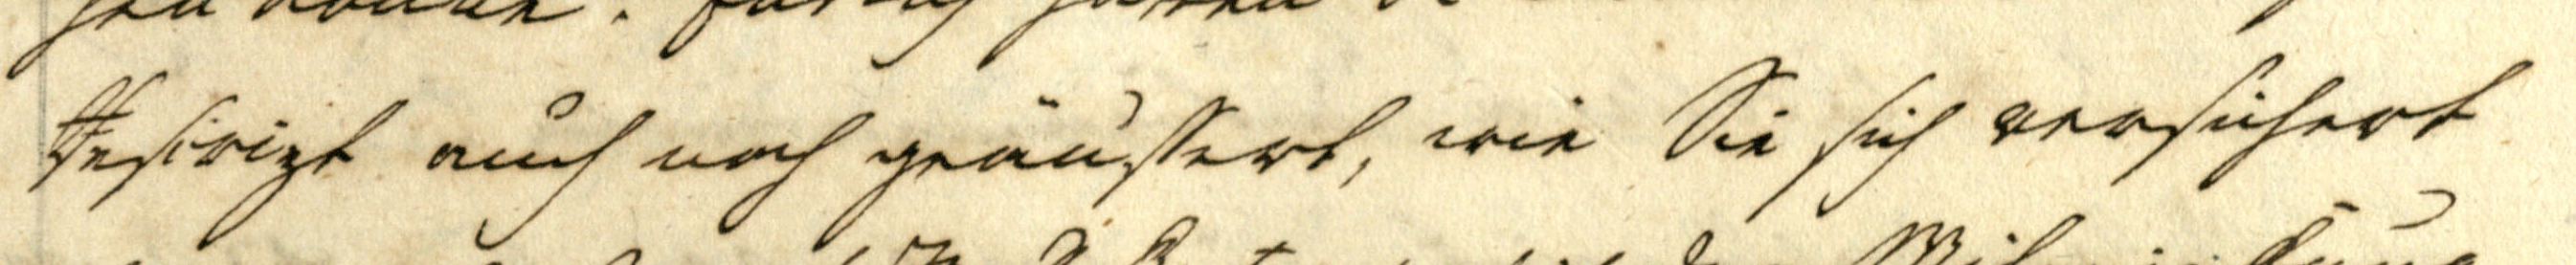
Rescript auch noch geäussert, wie Sie sich versichert
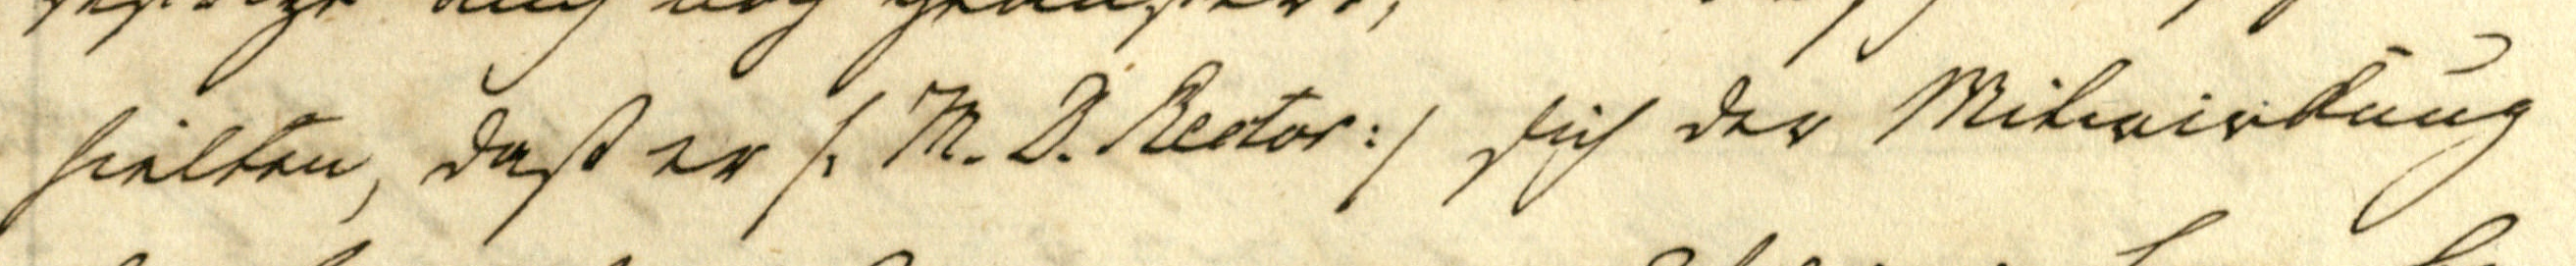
hielten, daß er /: M. D. Rector :/ sich der Mitwirkung
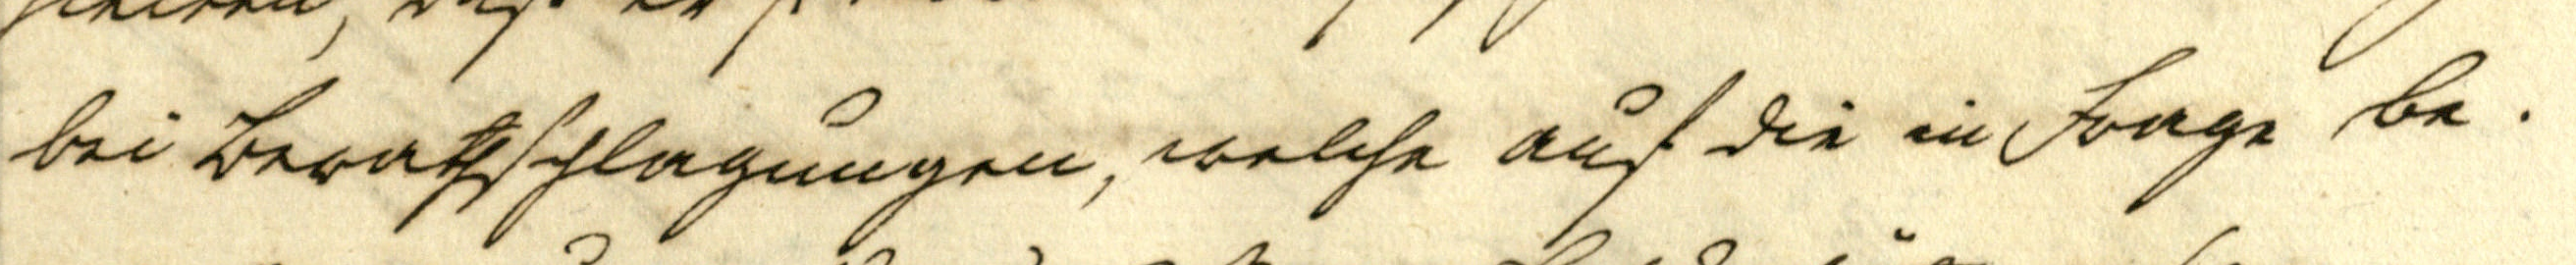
bei Berathschlagungen, welche auf die in Frage be¬
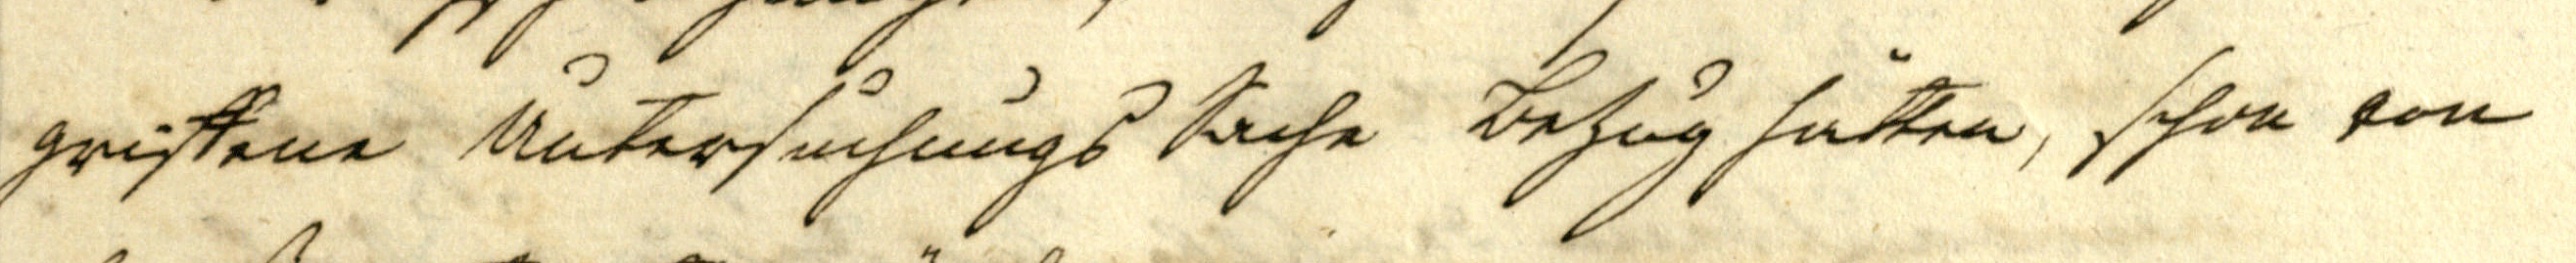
griffene Untersuchungs Sache Bezug hätten, schon von
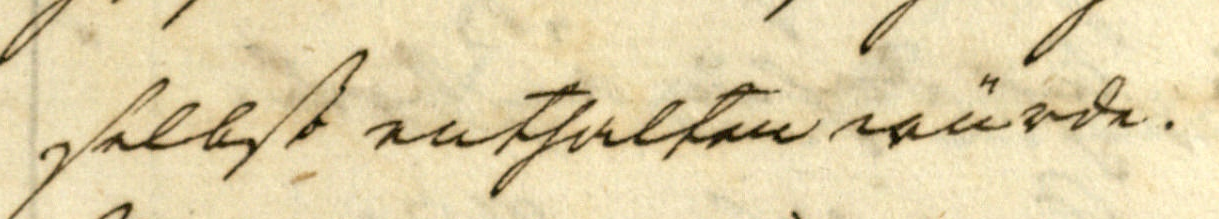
selbst enthalten würde.
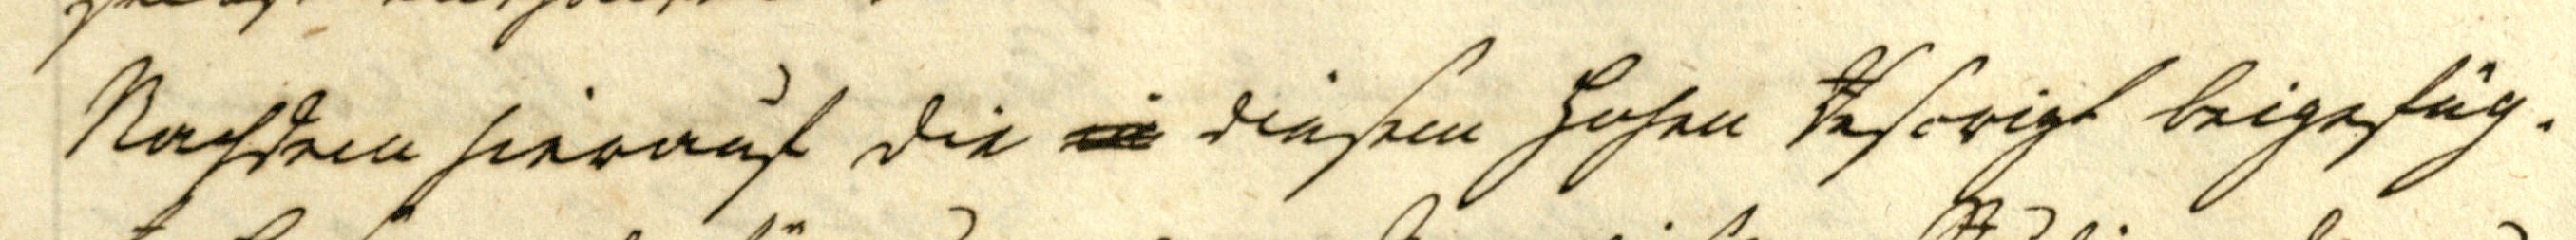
Nachdem hierauf die in diesem Hohen Rescript beigefüg¬
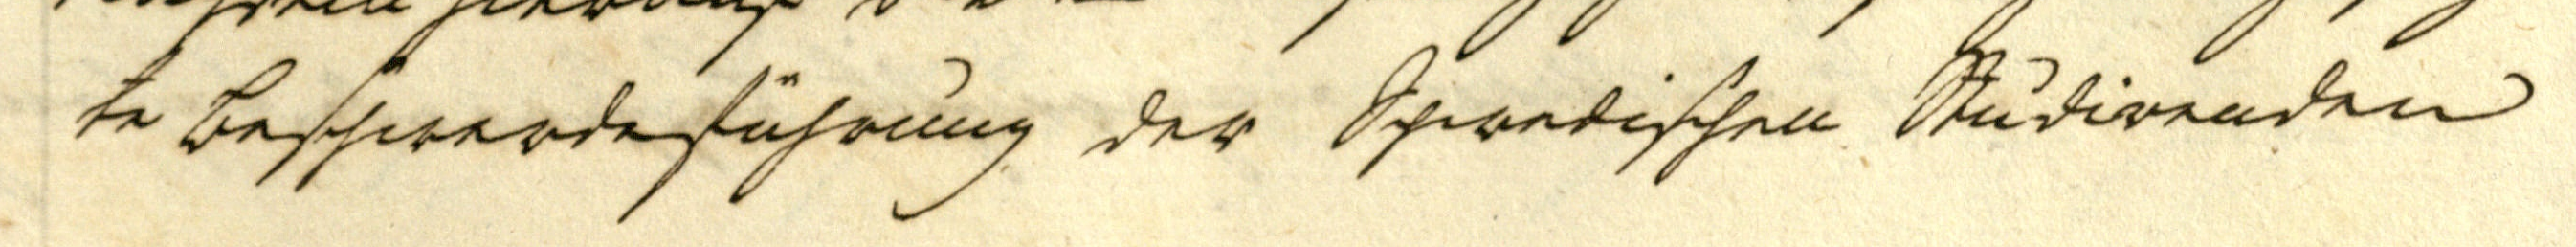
te Beschwerdeführung der Schwedischen Studirenden
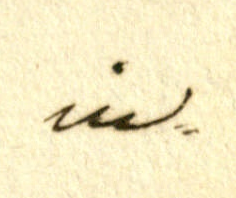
in
